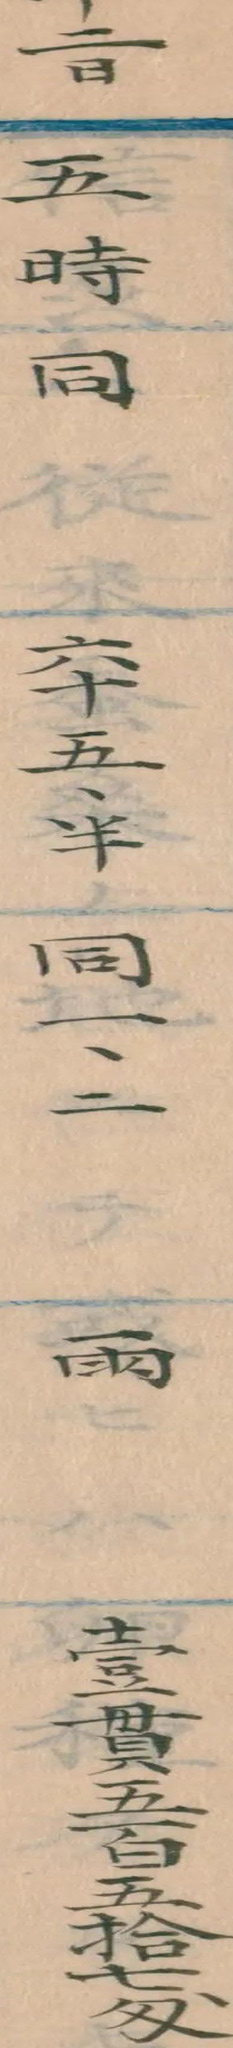十二日五時同六十五ヽ半同一ヽ二同雨壱貫五百五拾七匁二分
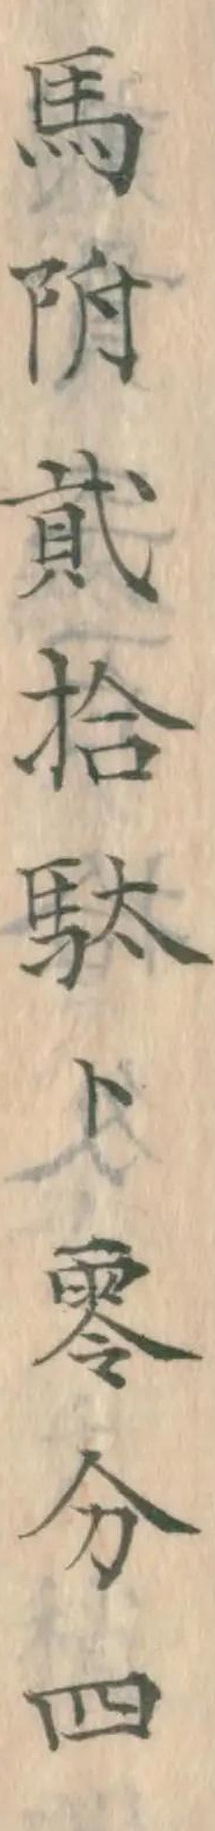馬附二十駄ト零分四
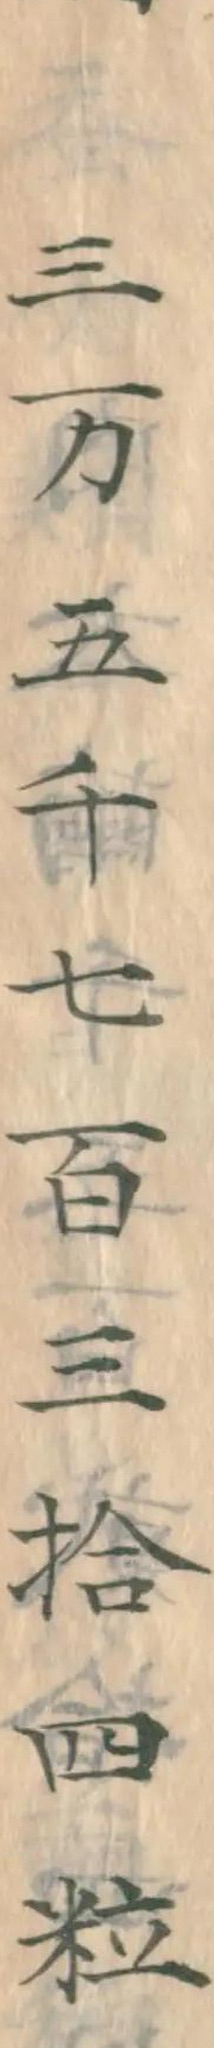繭三万五千七百三拾四粒

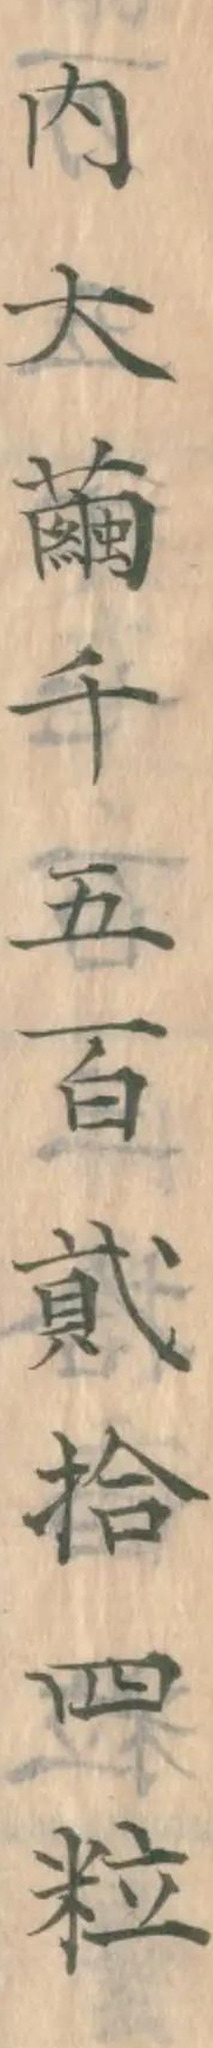内大繭千五百弐拾四粒
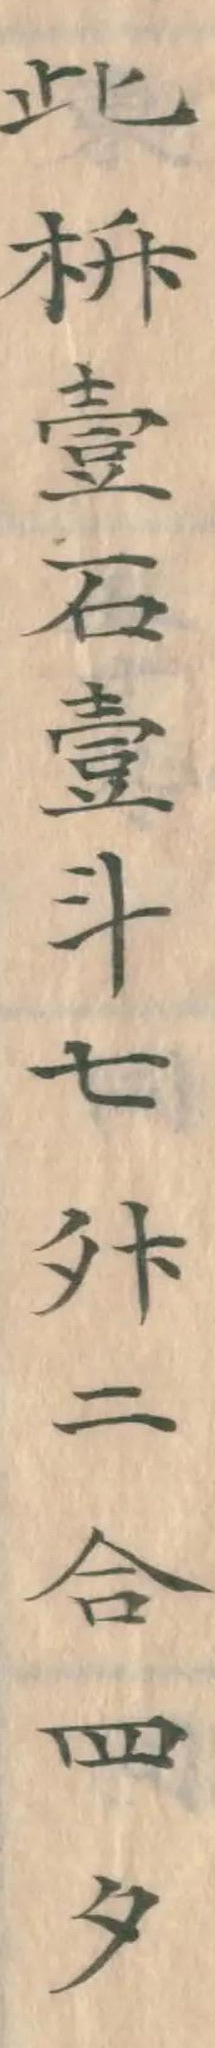此枡壱石壱斗七升二合四勺
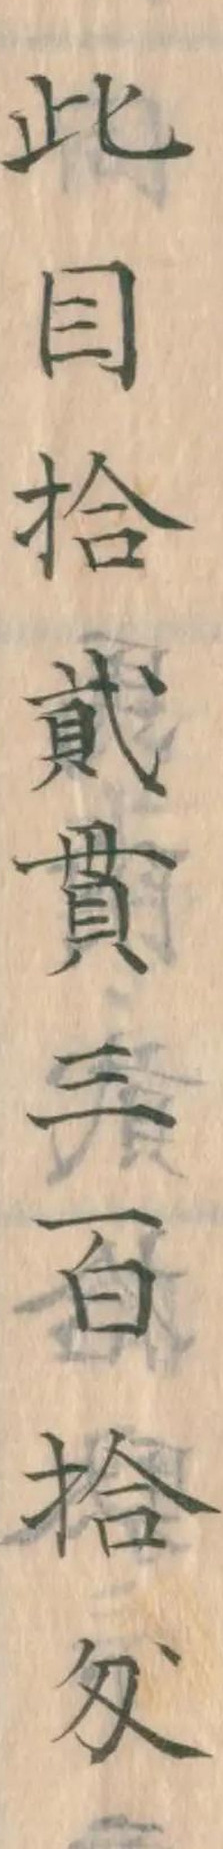此目拾弐貫三百拾匁
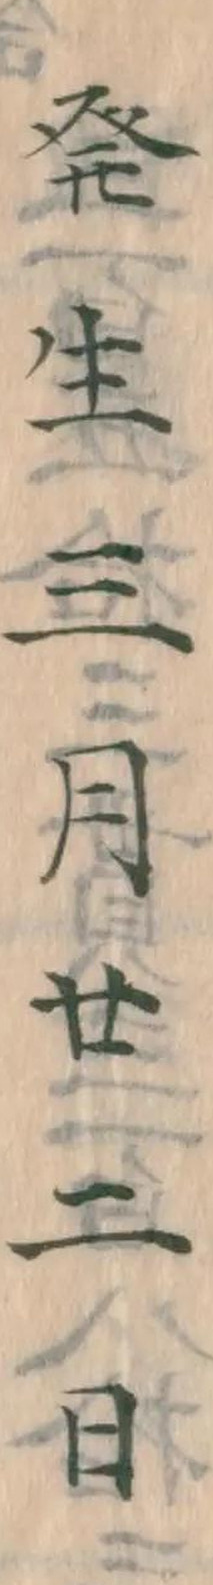発生三月廿二日
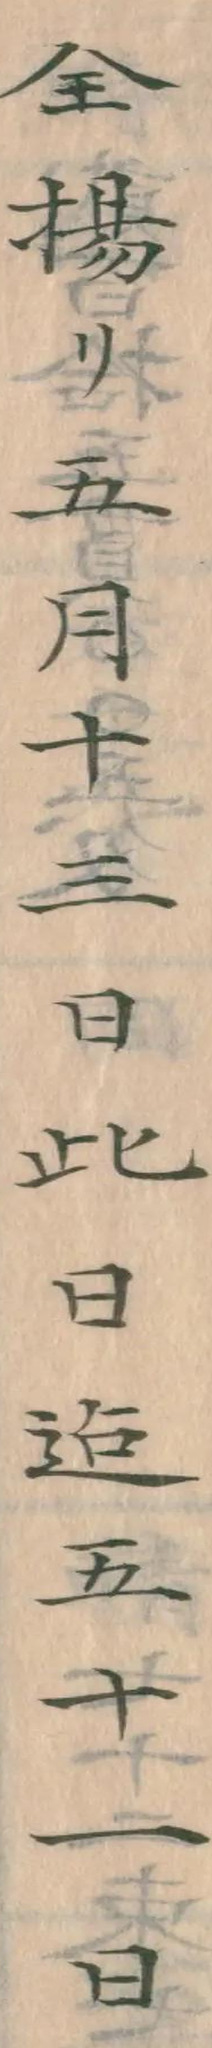全揚リ五月十三日此日迄五十一日
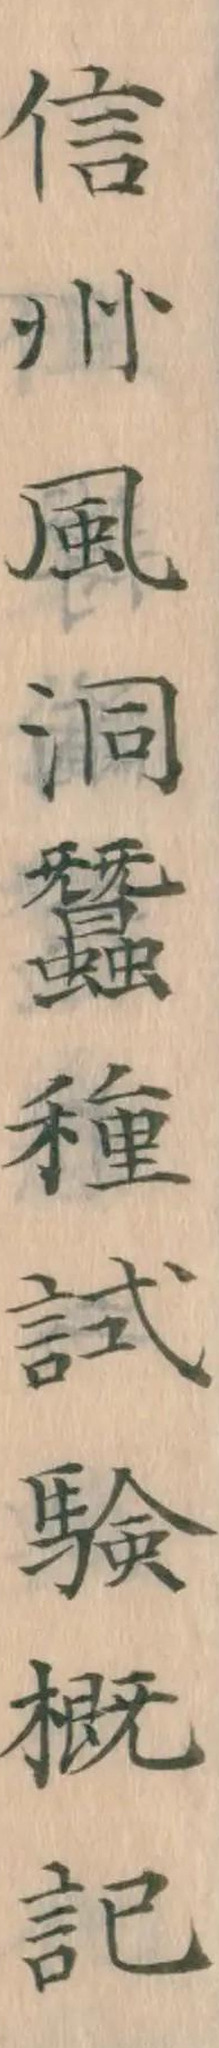信州風洞蚕種試験概記
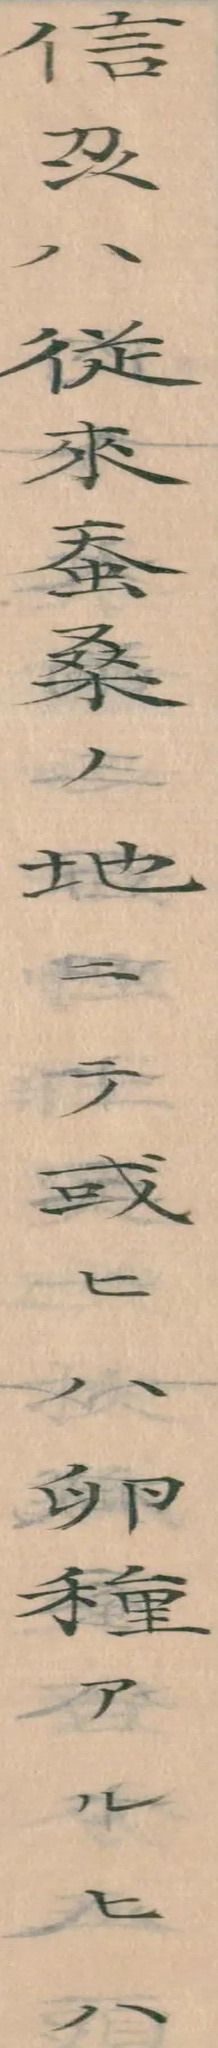信州ハ従来蚕桑ノ地ニテ或ヒハ卵種アルヒハ
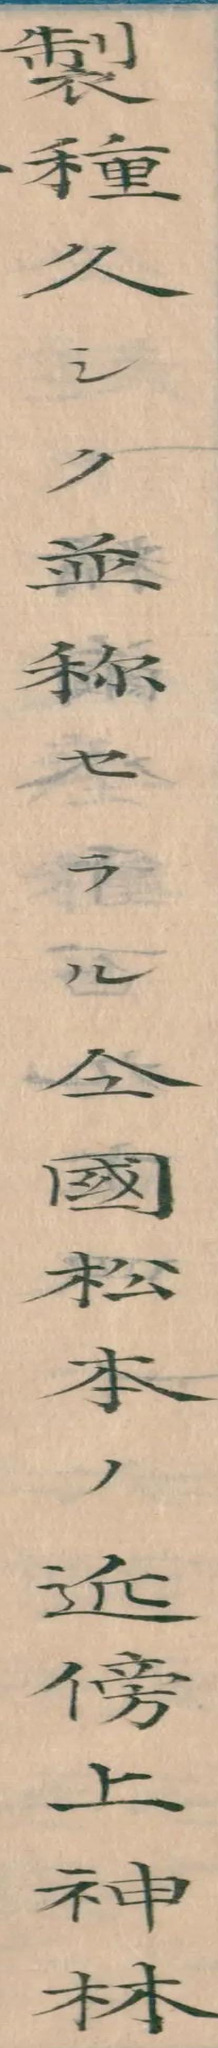製種久シク並称セラル仝国松本ノ近傍上神林
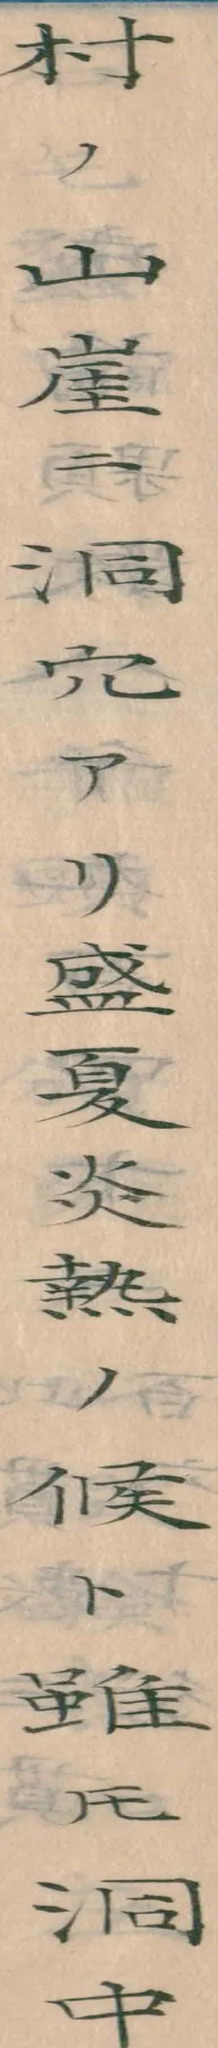村ノ山崖ニ洞穴アリ盛夏炎熱ノ候ト雖トモ洞中
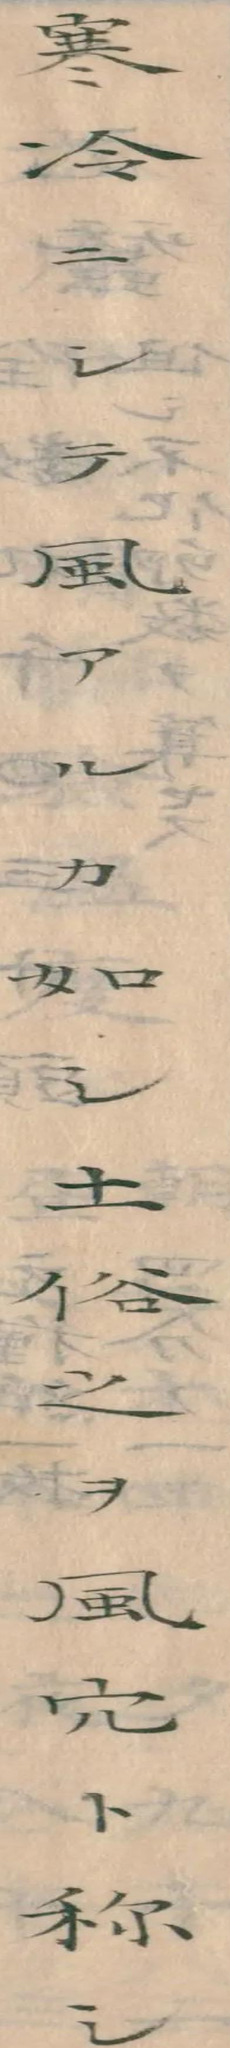寒冷ニシテ風アルカ如シ土俗之ヲ風穴ト称シ
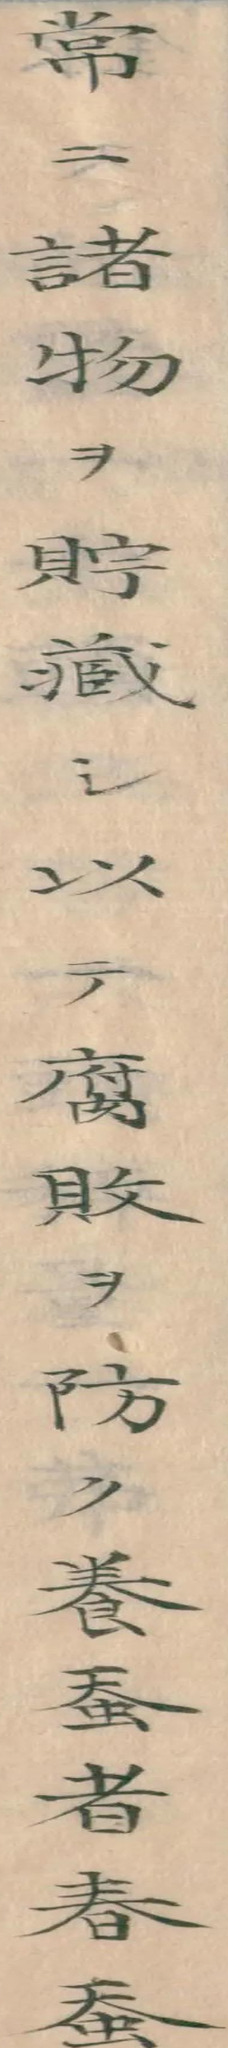常ニ諸物ヲ貯蔵シ以テ腐敗ヲ防ク養蚕者春蚕
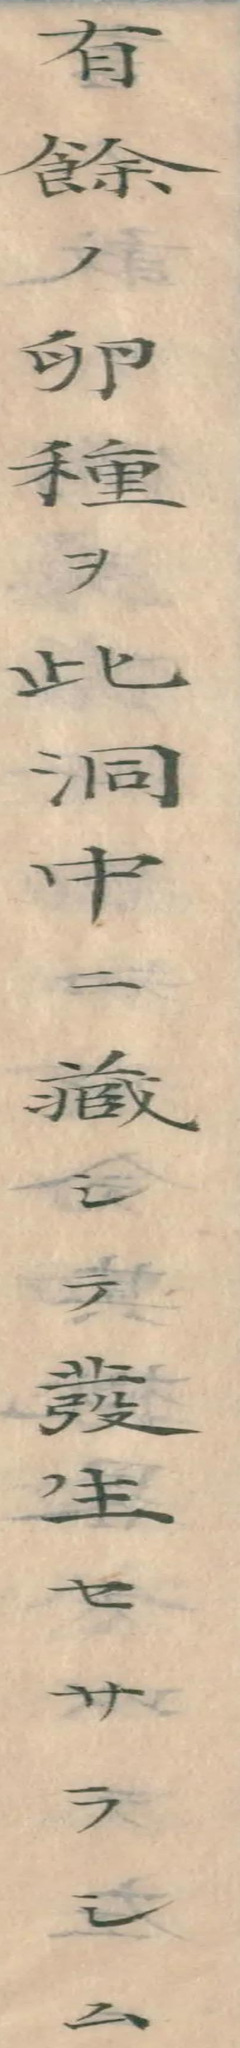有余ノ卵種ヲ此洞中ニ蔵シテ発生セサラシム
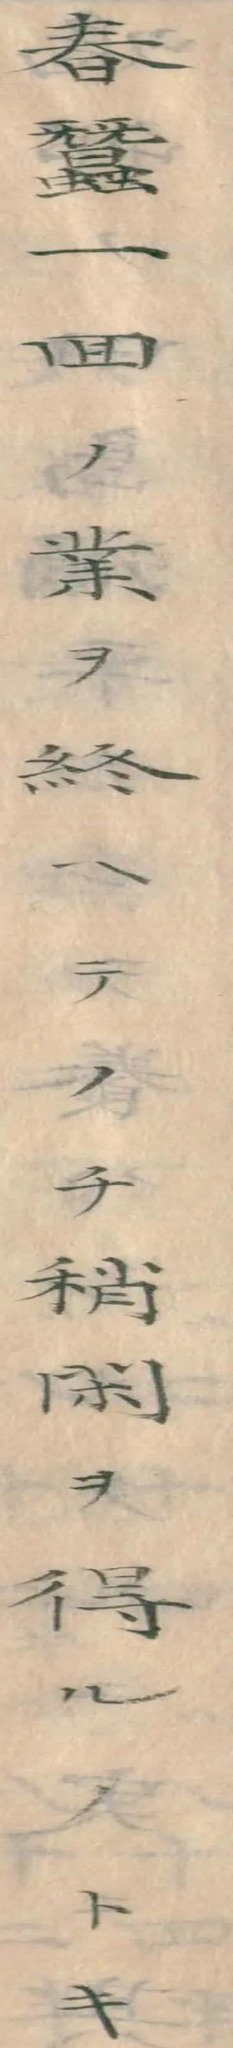春蚕一回ノ業ヲ終ヘテノチ稍閑ヲ得ルノトキ
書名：蚕桑集成
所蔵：国立国会図書館 National Diet Library, JAPAN
